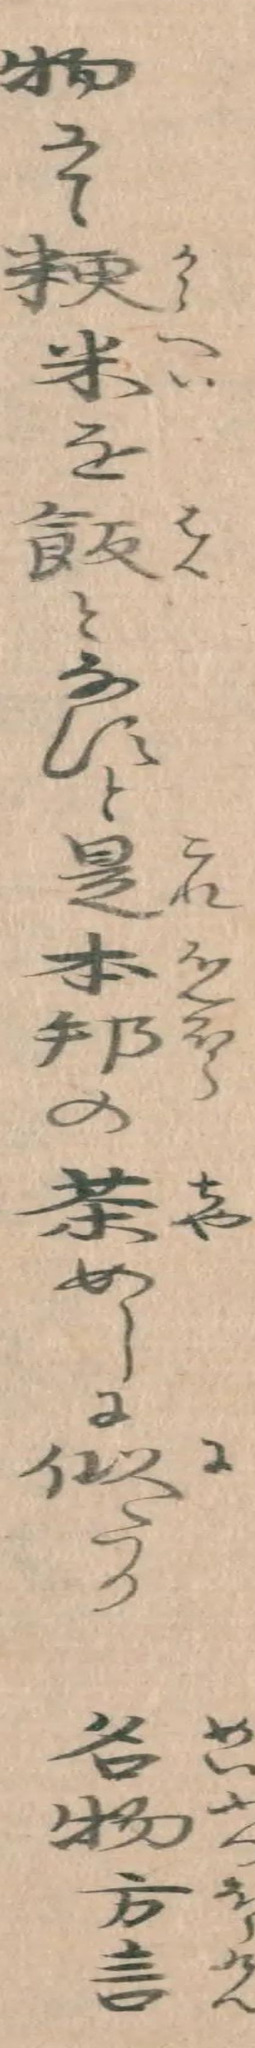物にて粳米を飯となすと是本邦の茶めしに似たり名物方言
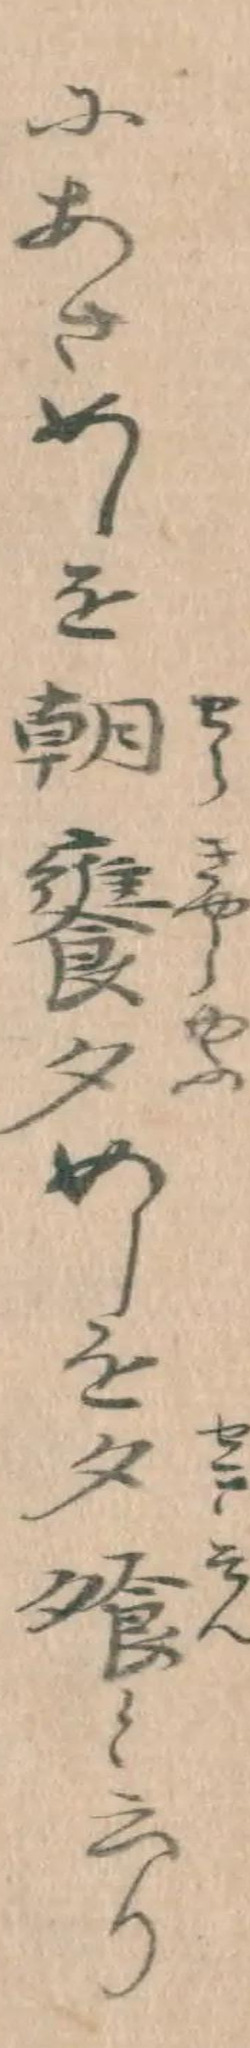にあさめしを朝饔夕めしを夕飧と云り
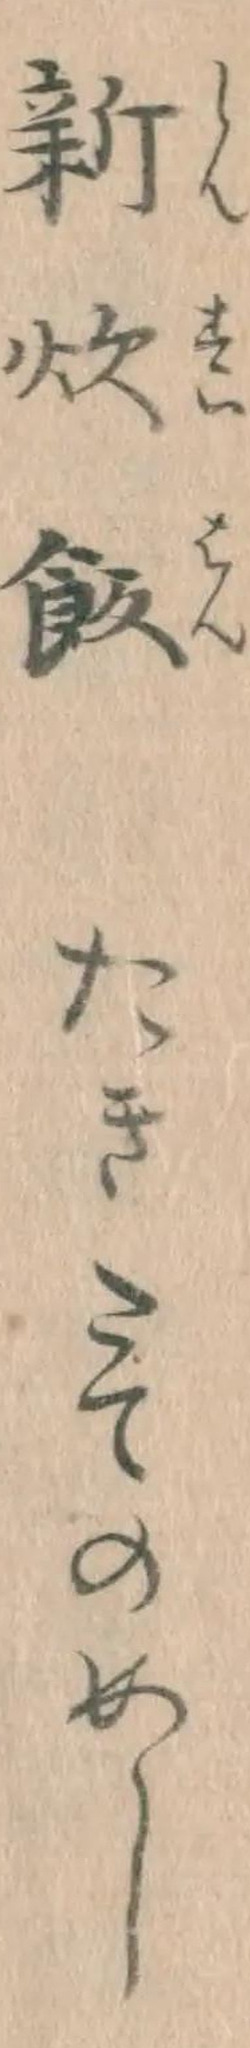新炊飯たきたてのめし
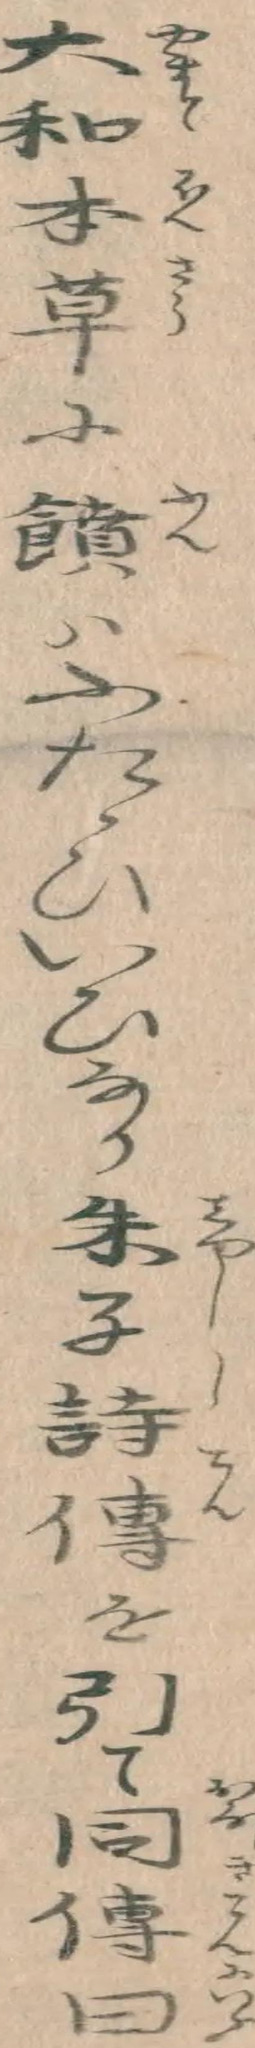大和本草に饙はふたゝひいひなり朱子詩伝を引て同伝曰
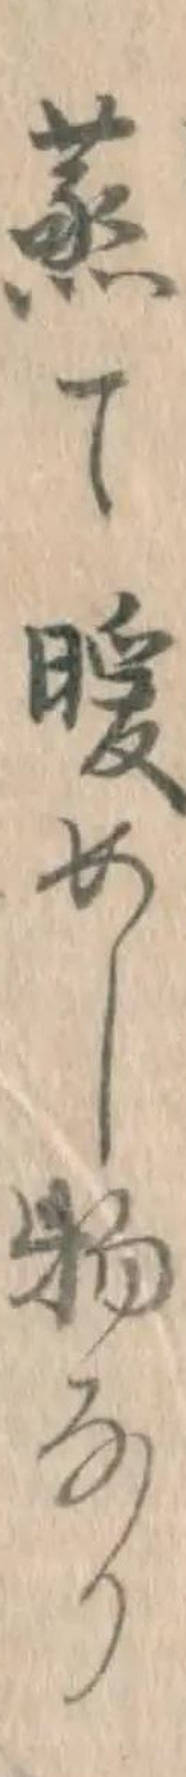蒸て暖めし物なり
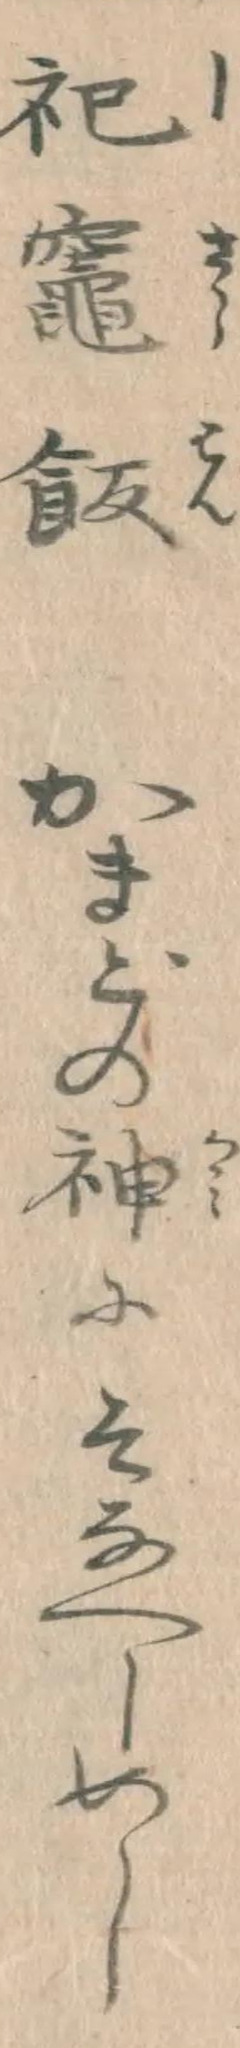祀竈飯かまどの神にそなへしめし
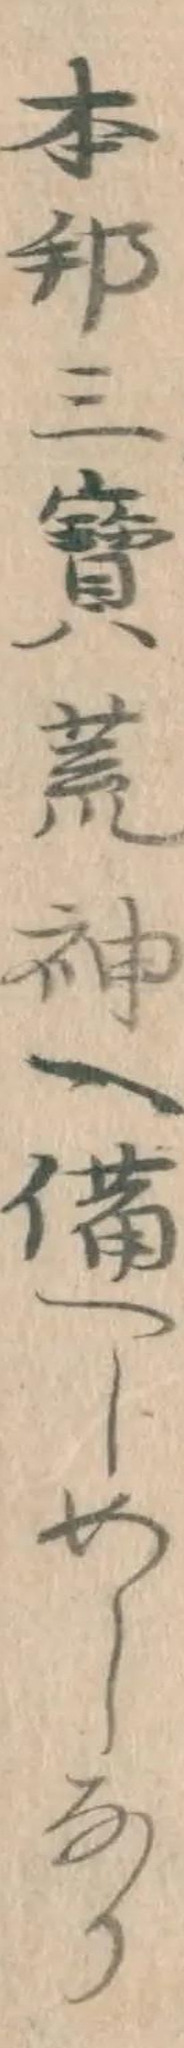本邦三宝荒神へ備へしめしなり

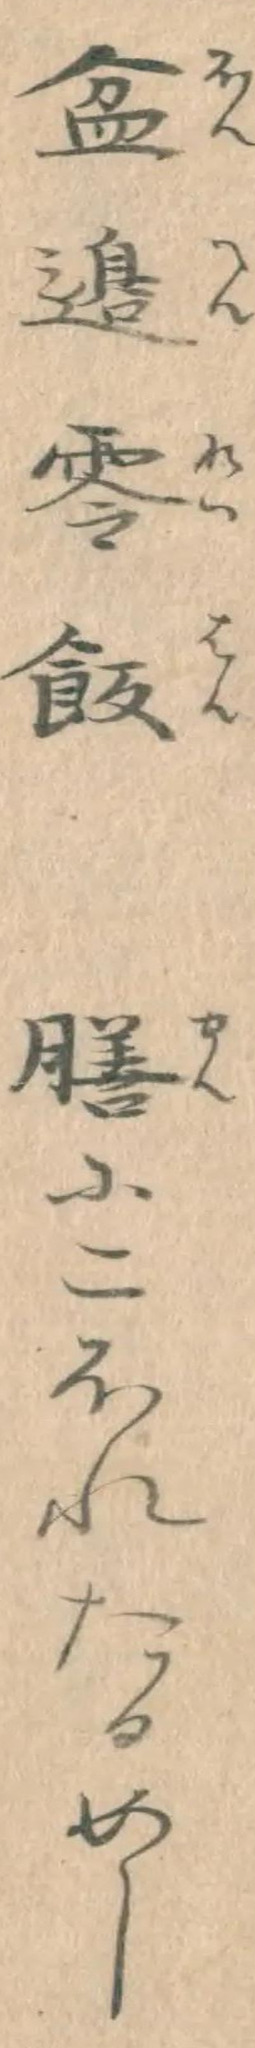盆辺零飯膳にこほれたるめし
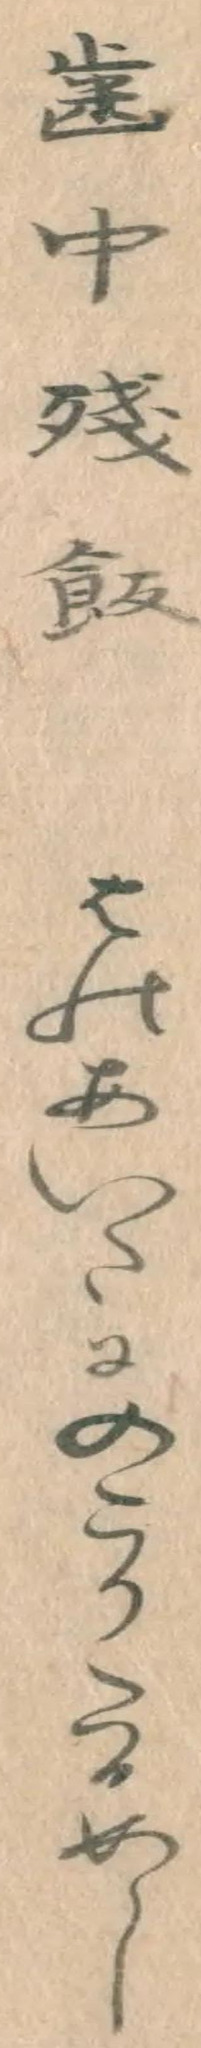歯中残飯はのあいたにのこりたるめし
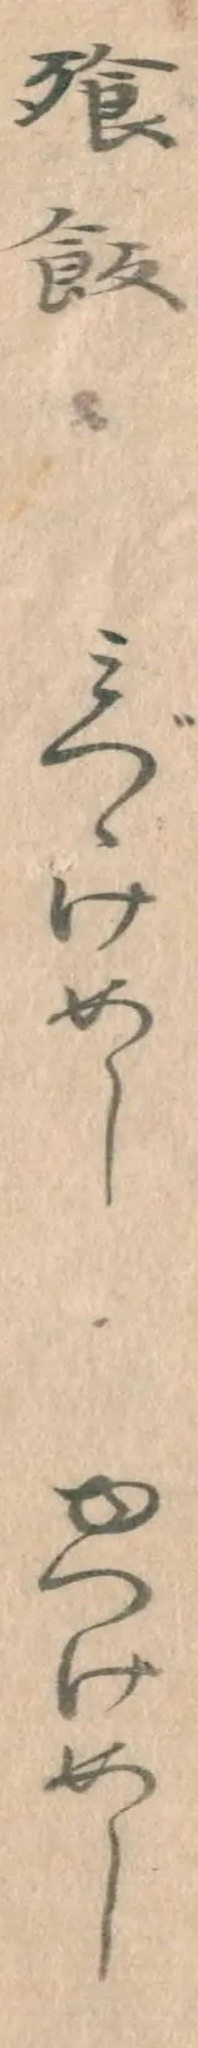飧飯みづゝけめしゆつけめし
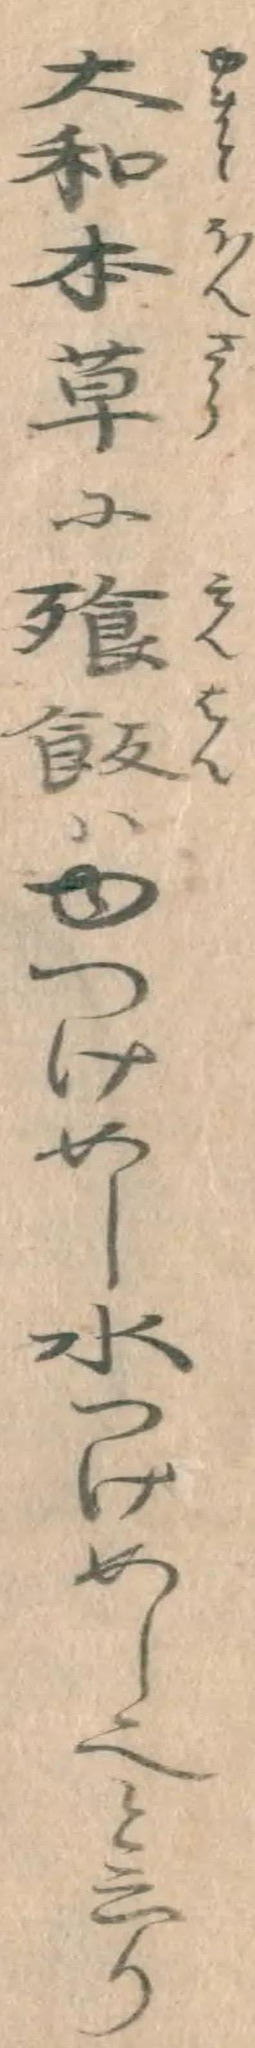大和本草に飧飯はゆつけめし水つけめし也と云り
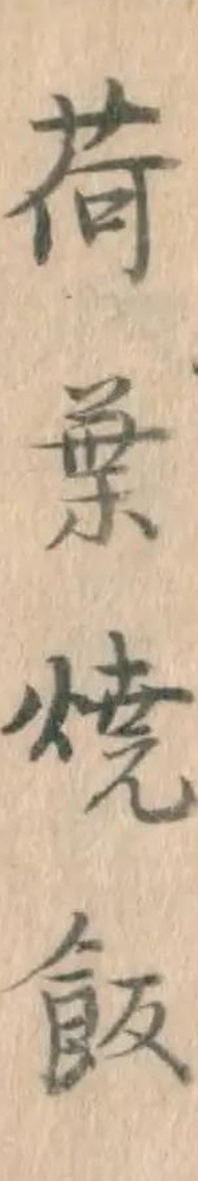荷葉焼飯
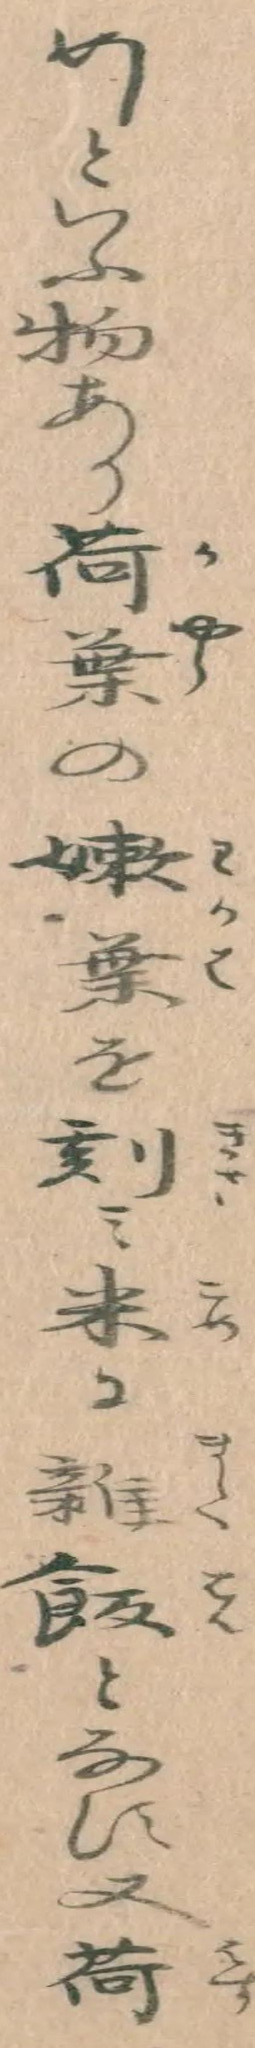めしといふ物あり荷葉の嫩葉を刻み米に雑飯となす又荷
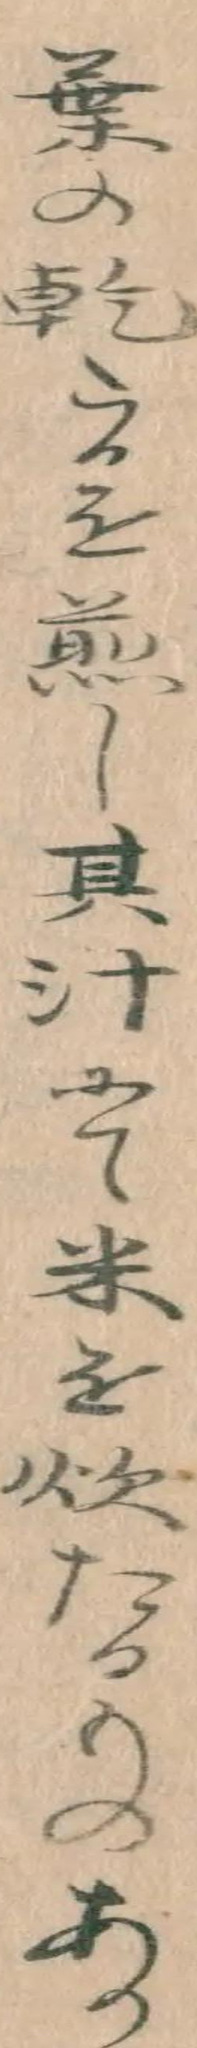葉の乾たるを煎し其汁にて米を炊たるものあり
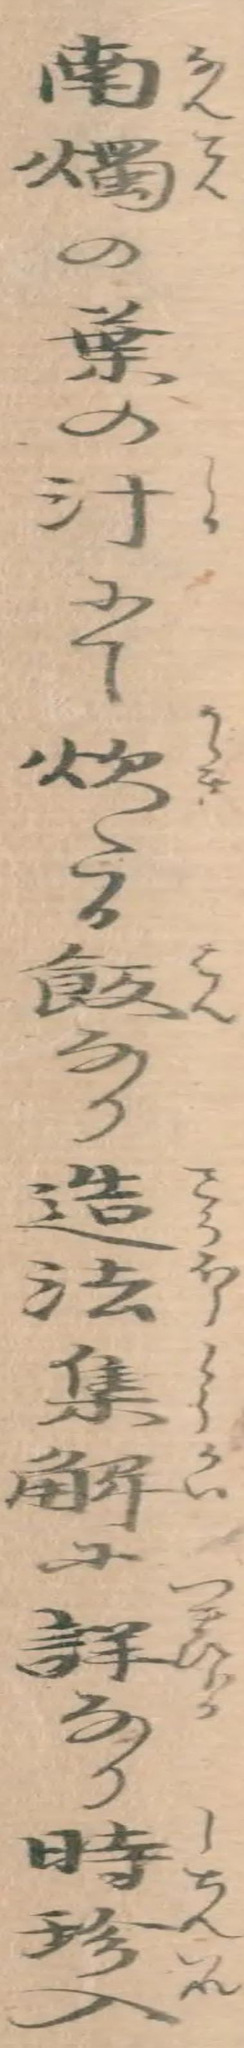南燭の葉の汁にて炊たる飯なり造法集解に詳なり時珍入
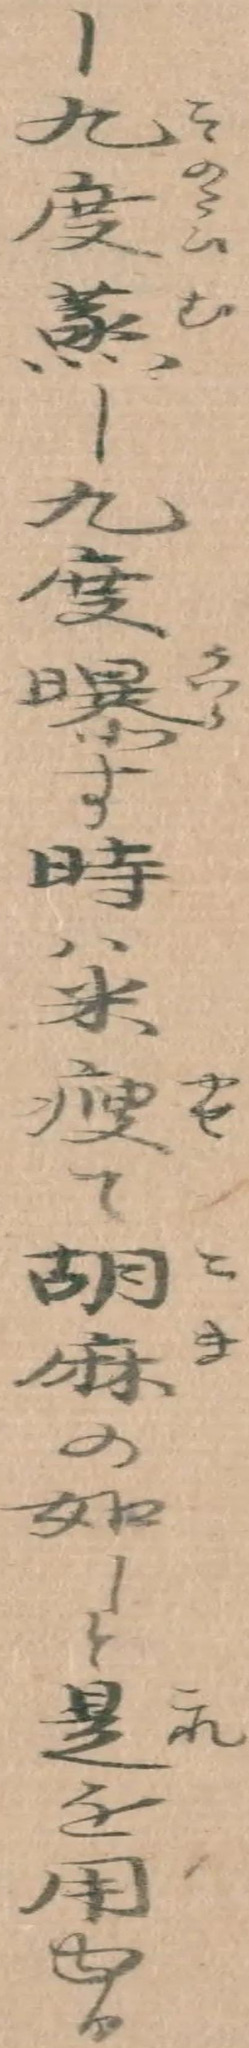し九度蒸し九度曝す時は米痩て胡麻の如しと是を用ゆる
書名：本草図譜. 巻43-45
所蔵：国立国会図書館 National Diet Library, JAPAN
